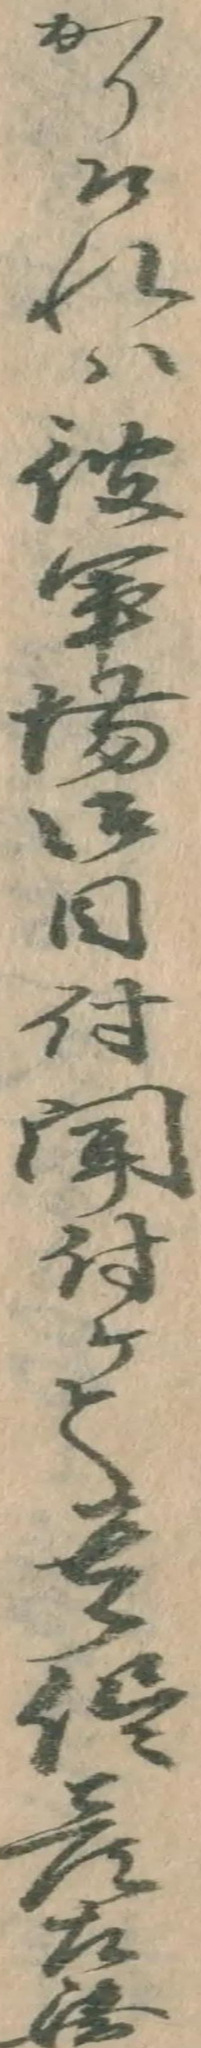かりけれは彼軍場御目付聞付けて其侭彦左衛
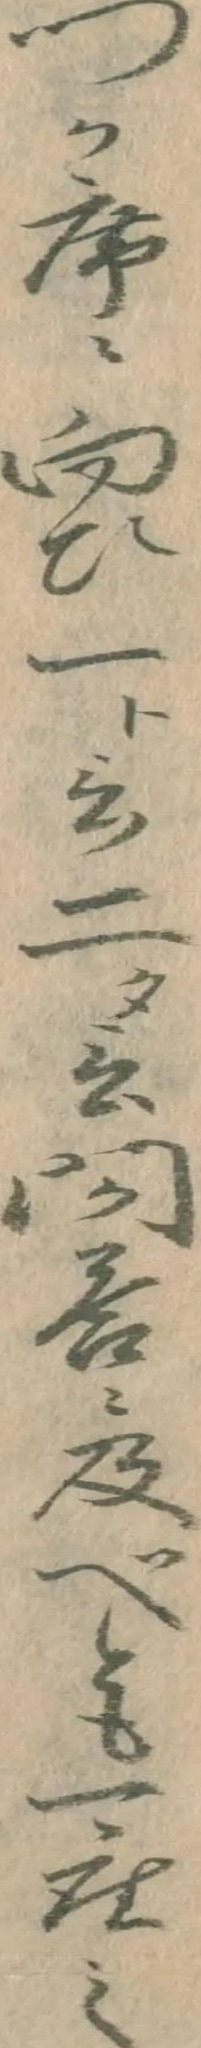門か席に向ひ一と云二た云問答に及べとも可座之

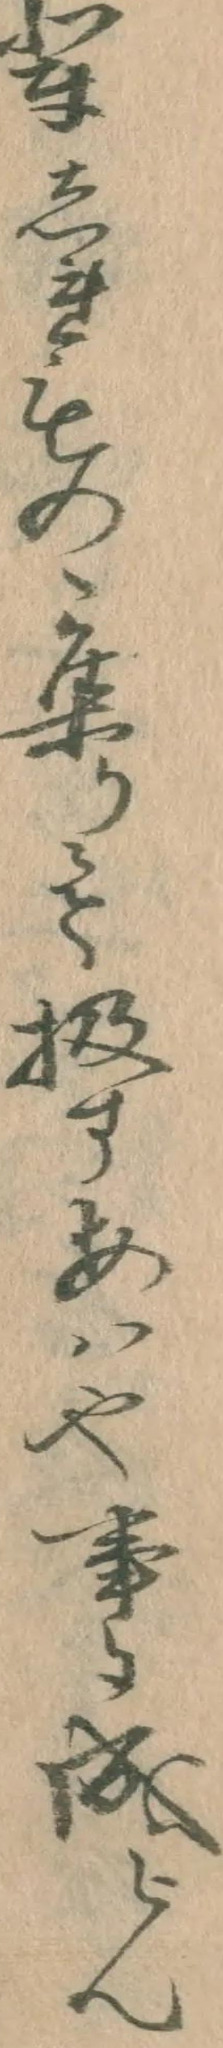輩志連ものゝ集りにて扱すあはや事尓成らん
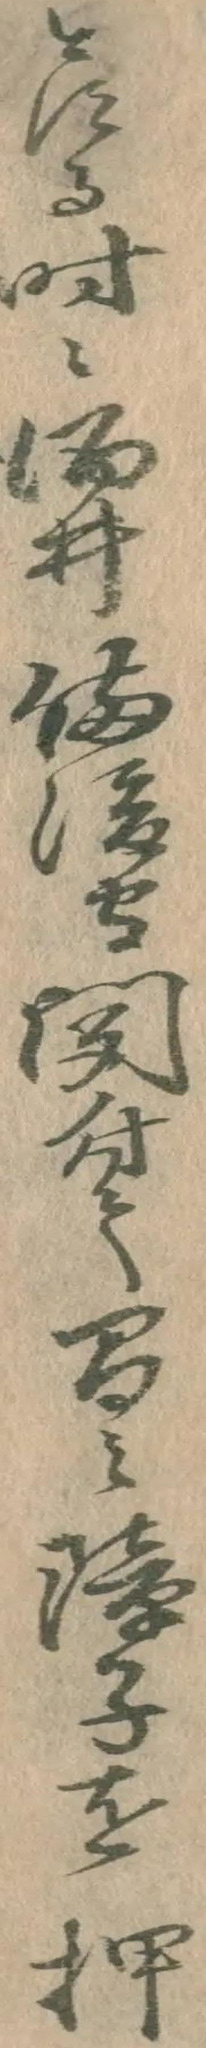と須る時に酒井備後守聞付て間之障子を押
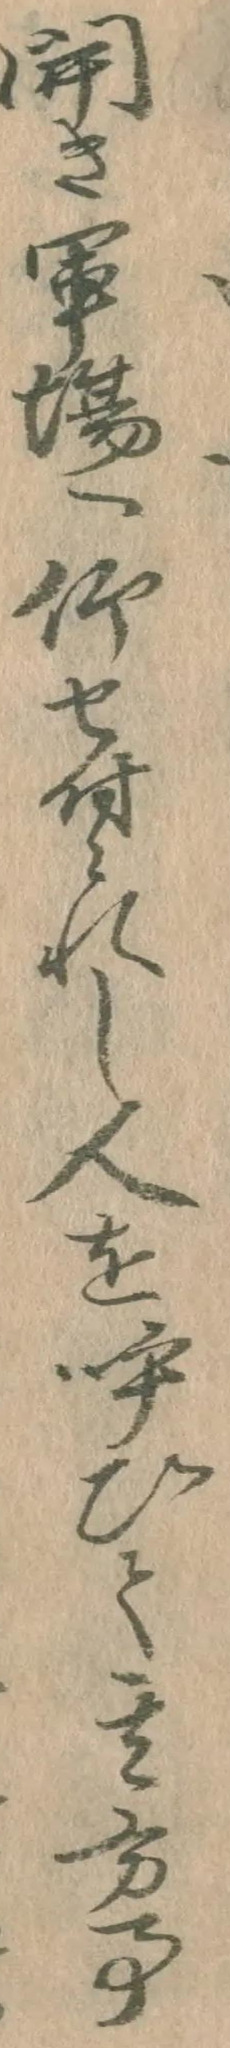開き軍場へ仰せ付られし人を呼びて其方事
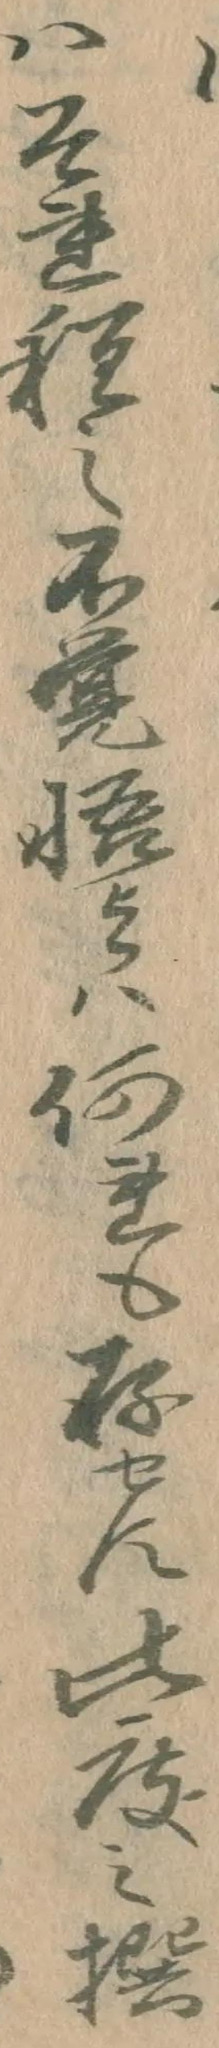はそ連程之不覚悟与は何連も存せ須此度之撰
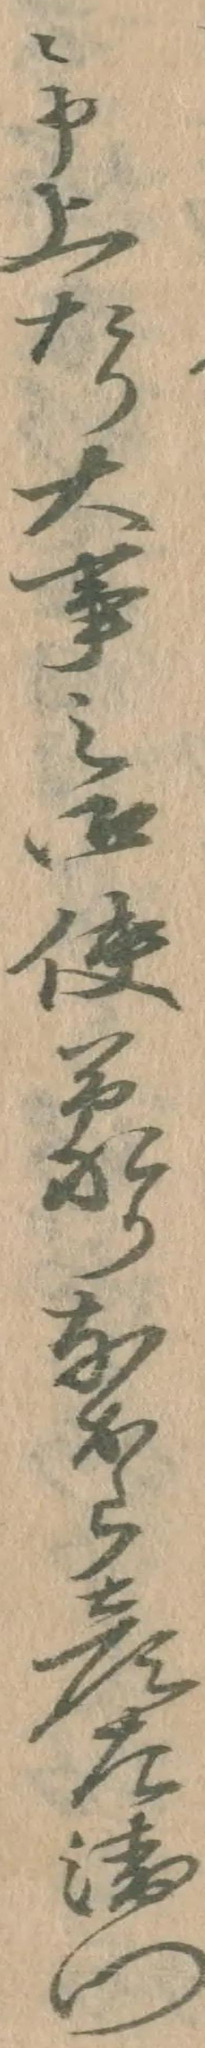に申上たり大事之御使承りなから彦左衛門
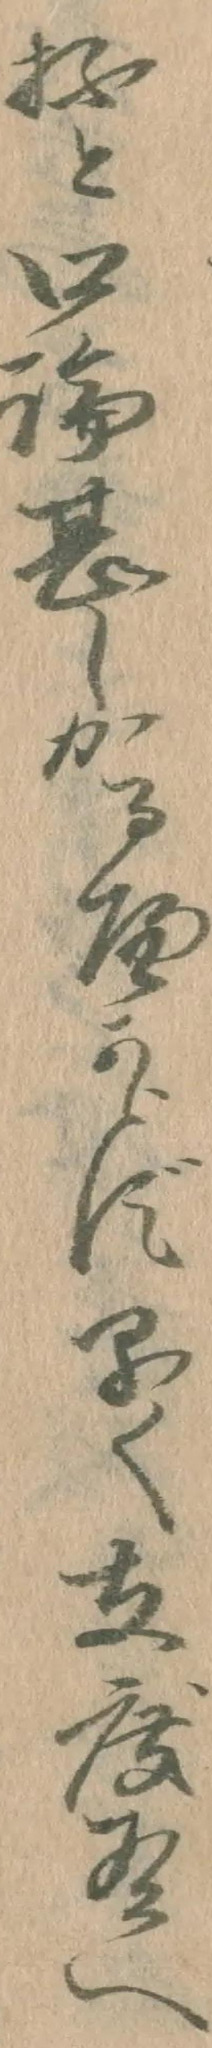抔と口論甚しかる扁可ら須早く支度有へ
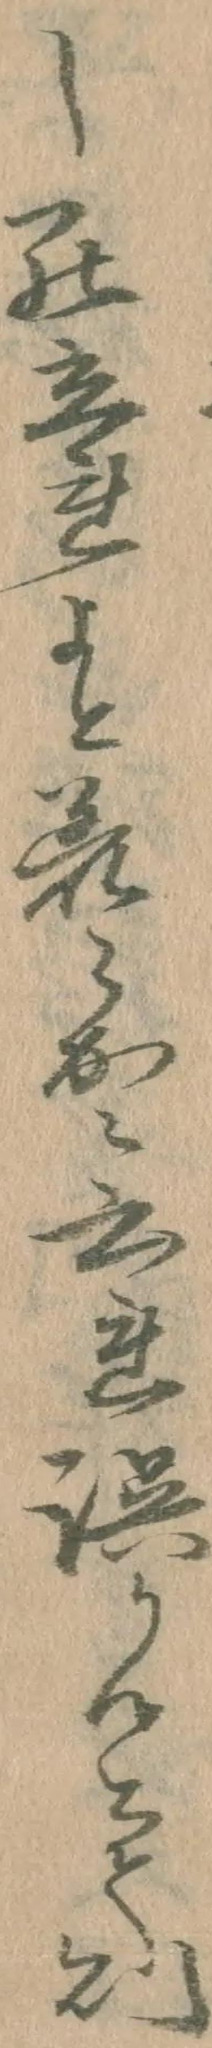し罷立連よと荒らかに云連誤り候とて則
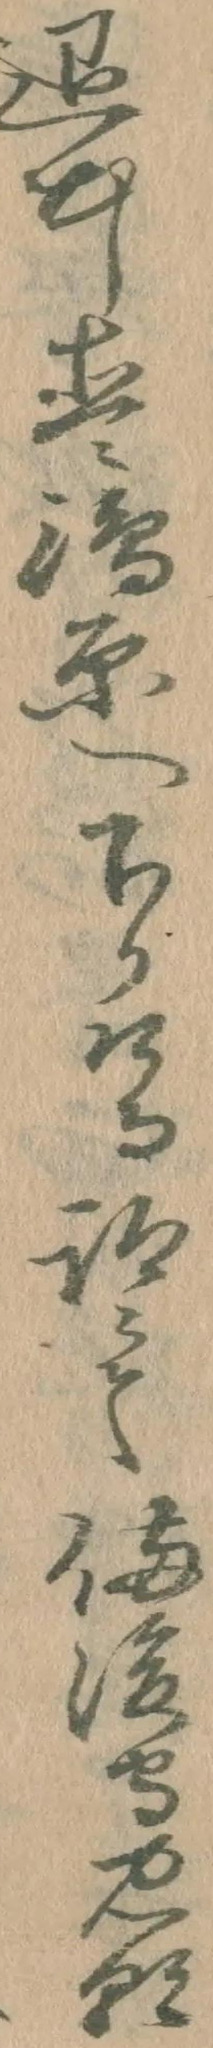退出し直に島原へ下りける跡にて備後守忠朝
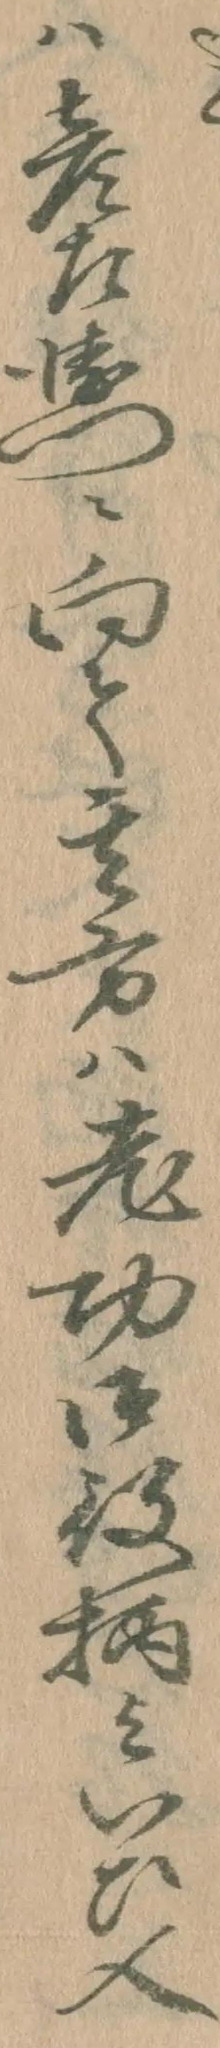は彦左衛門に向て其方は老功御役柄与いひ人
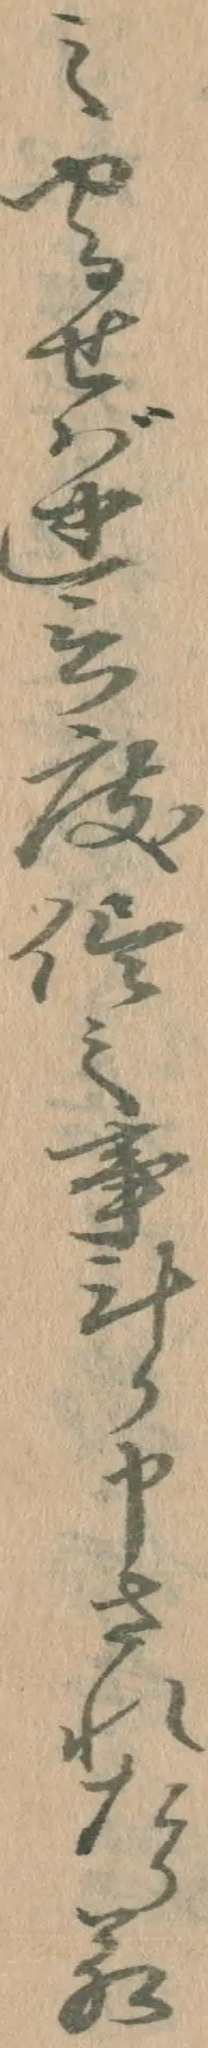之ゆるせば迚云度侭の事斗り申されたり若
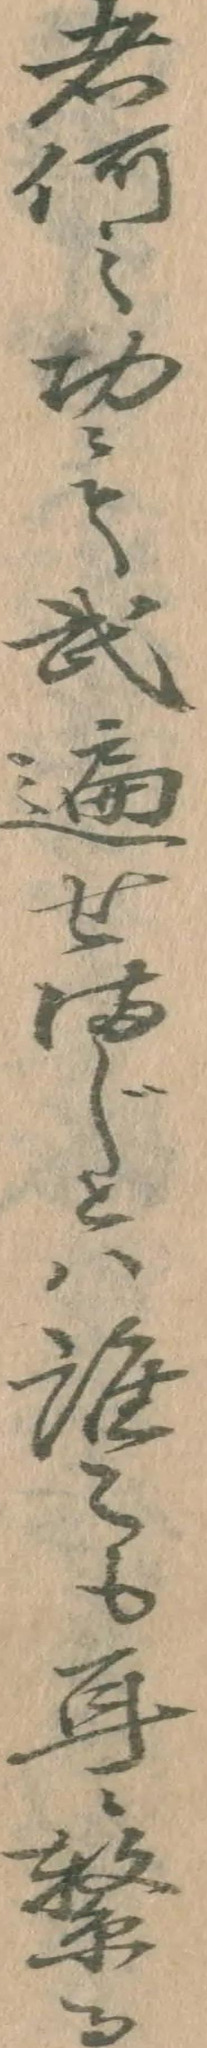者何之功にて武遍せ満じとは誰にも耳に繋る
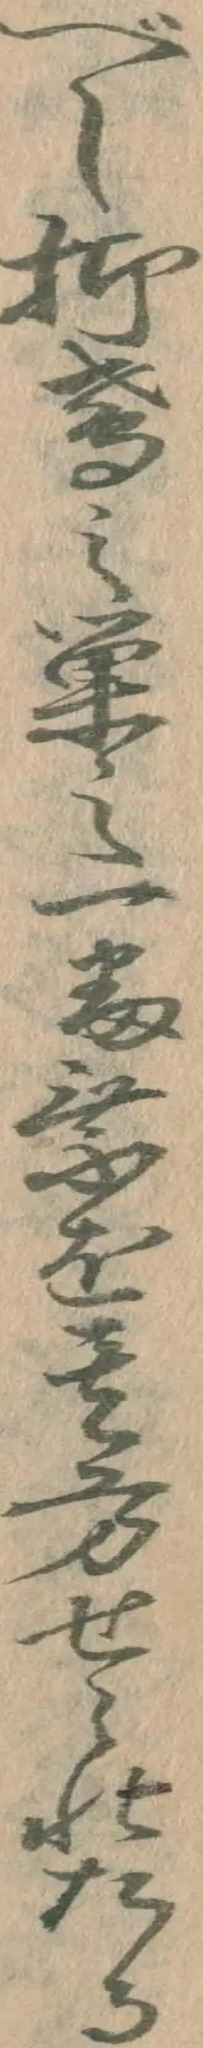べし柳鳶之巣之一番乗を其方せられたる
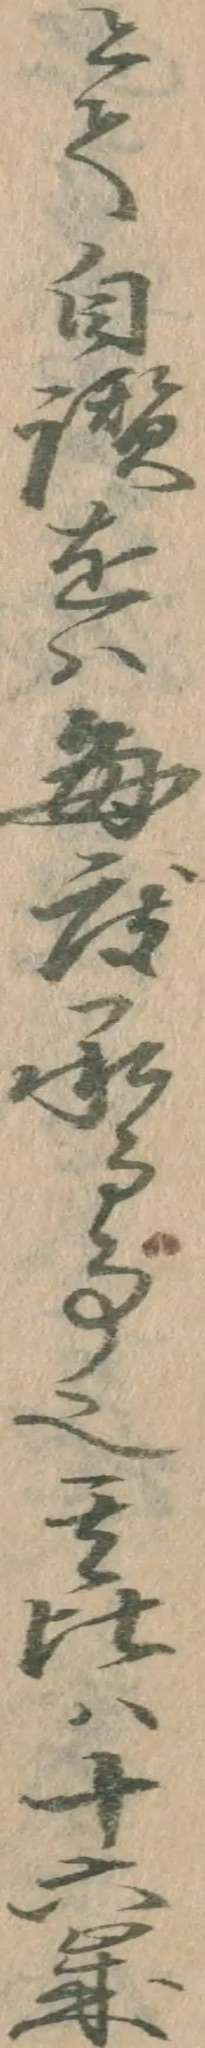とて自讃をは毎度承る事也其比は十六歳
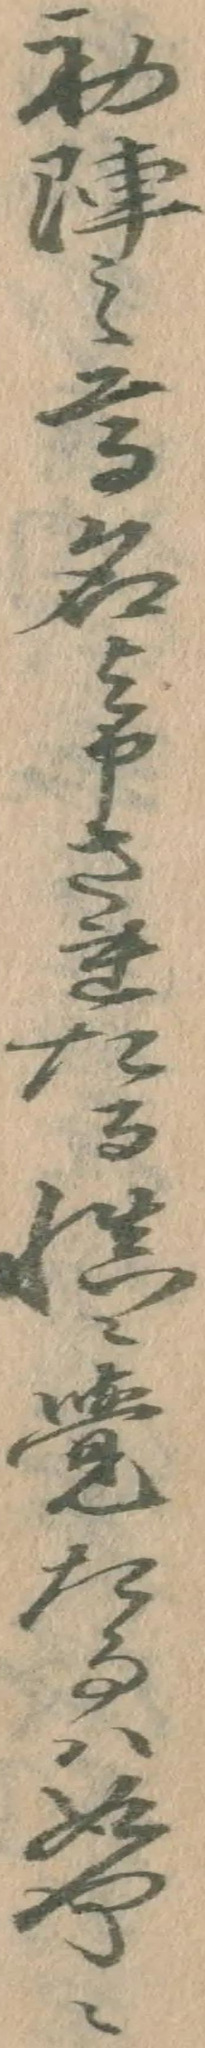初陣之高名与申さ連たる慥に覚たるは如何に
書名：切支丹御退治記 49巻. [2]
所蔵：国立国会図書館 National Diet Library, JAPAN
